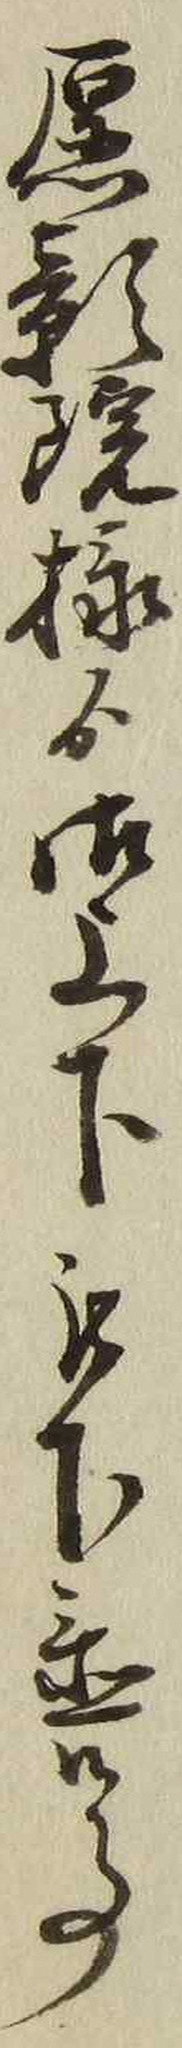愿彰院様ゟ御上下被下置候事
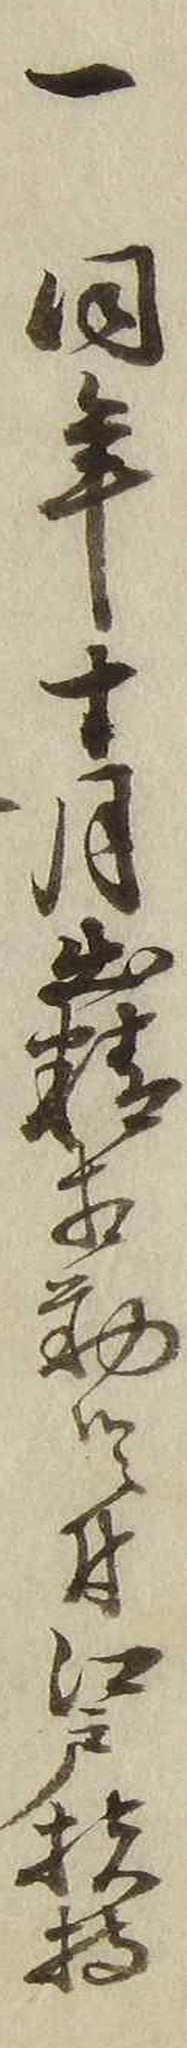一同年十月出精相勤候ニ付江戸扶持
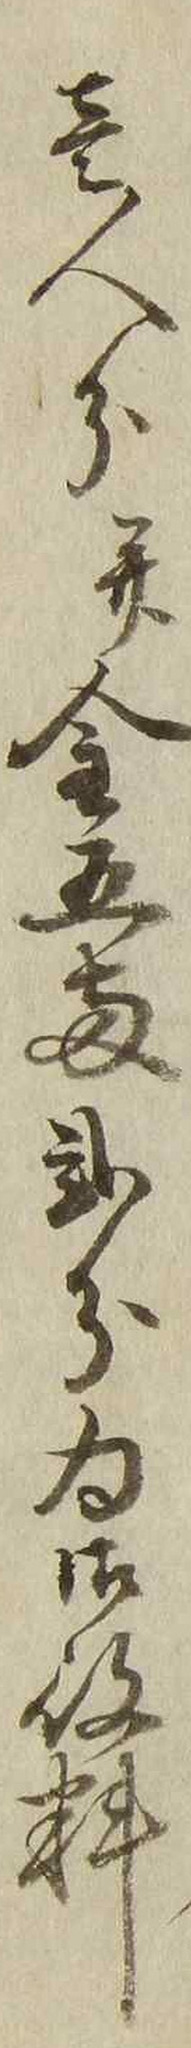壱人分并金五両弐分為御役料

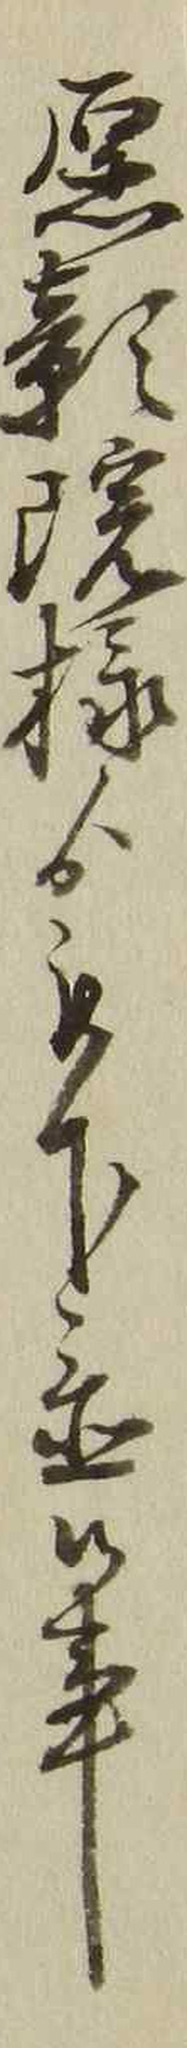愿彰院様ゟ被下置候事
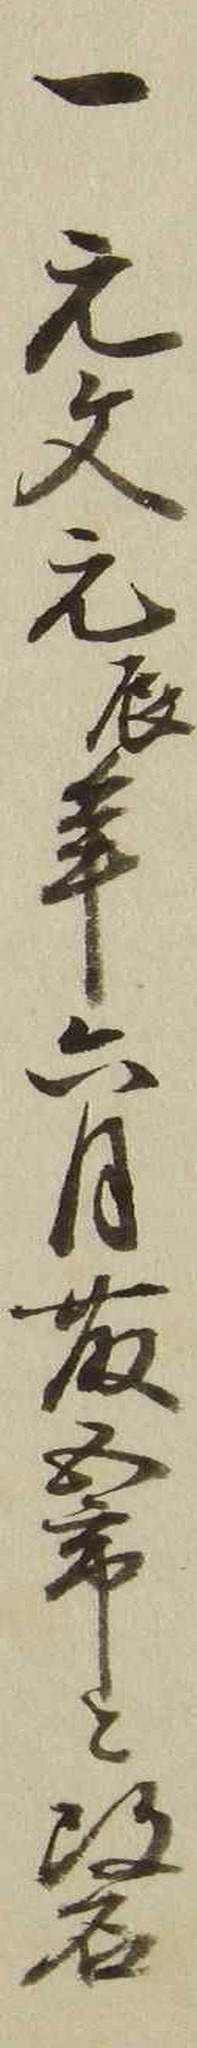一元文元辰年六月藤五郎と改名
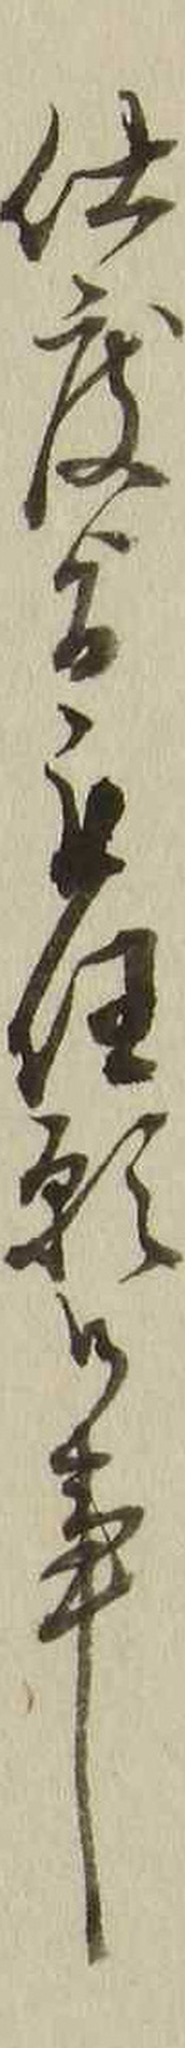仕度旨被任願候事
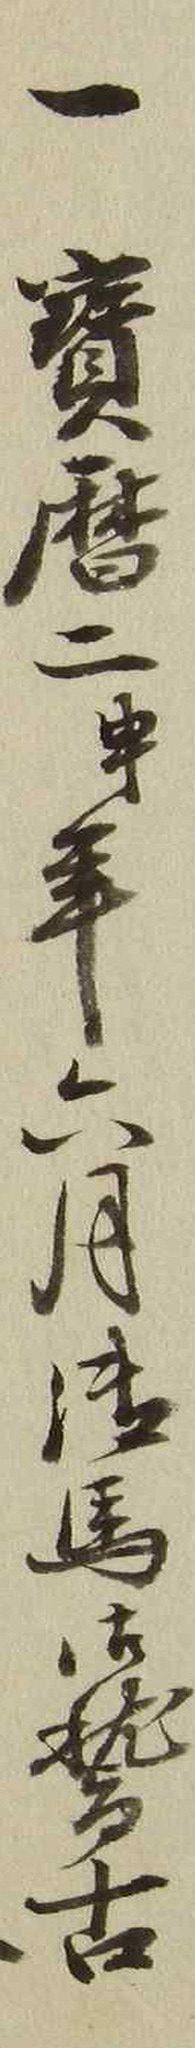一宝暦二申年六月御馬御稽古
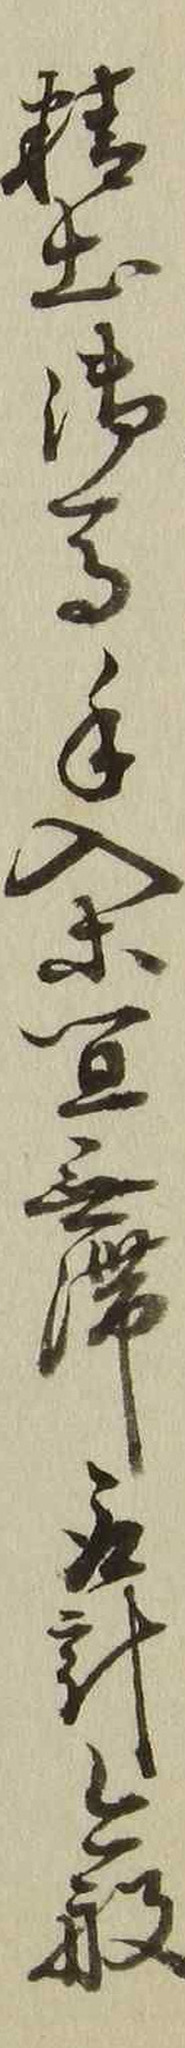精出御馬手入等宜無滞取計今般
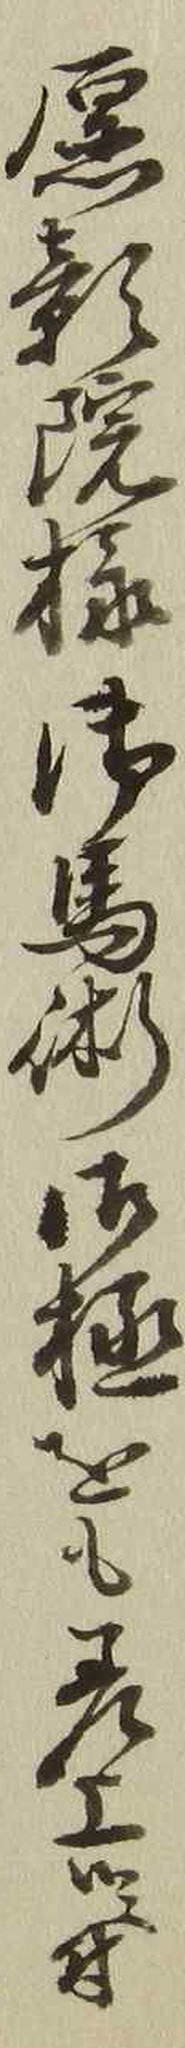愿彰院様御馬術御極をも差上候ニ付
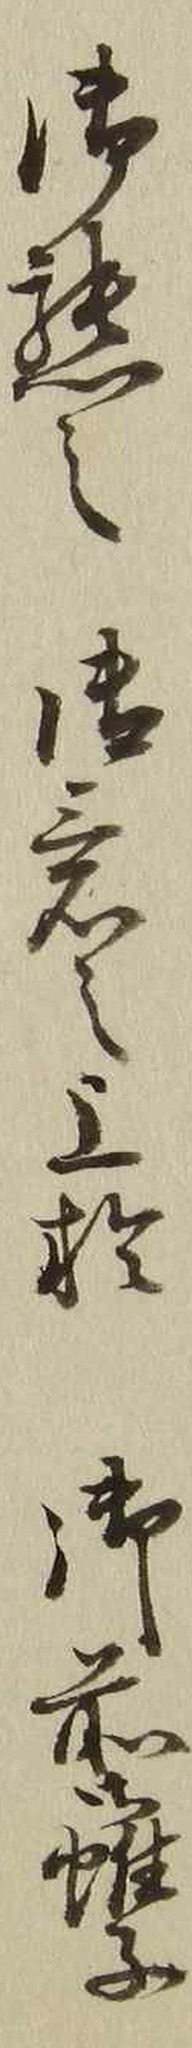御懇之御意之上於御前御帷子
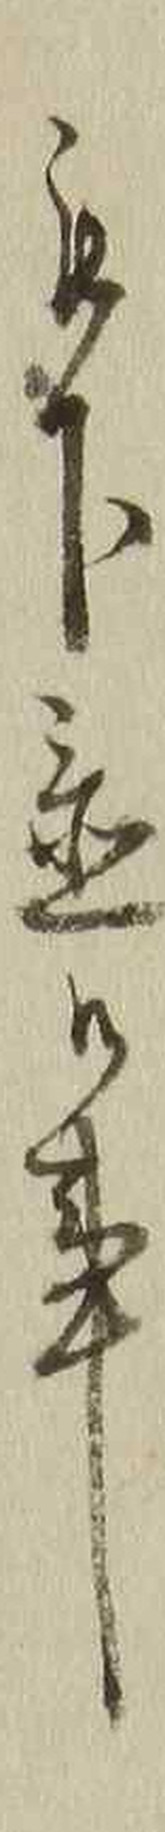被下置候事
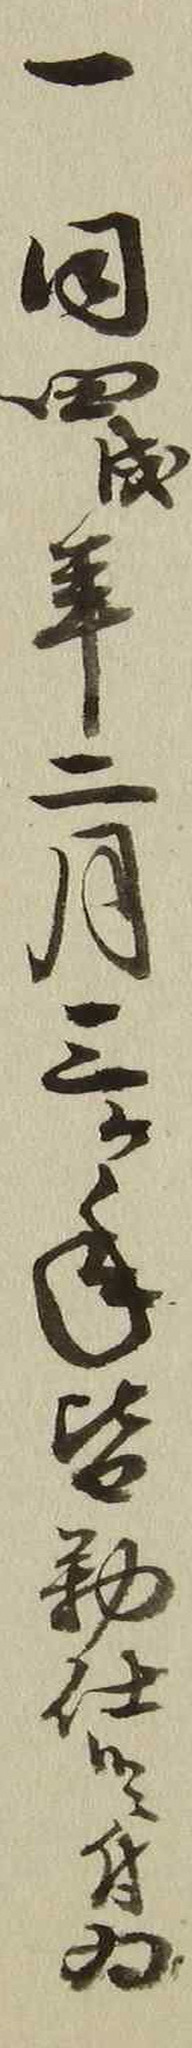一同四戌年二月三ケ年皆勤仕候ニ付為
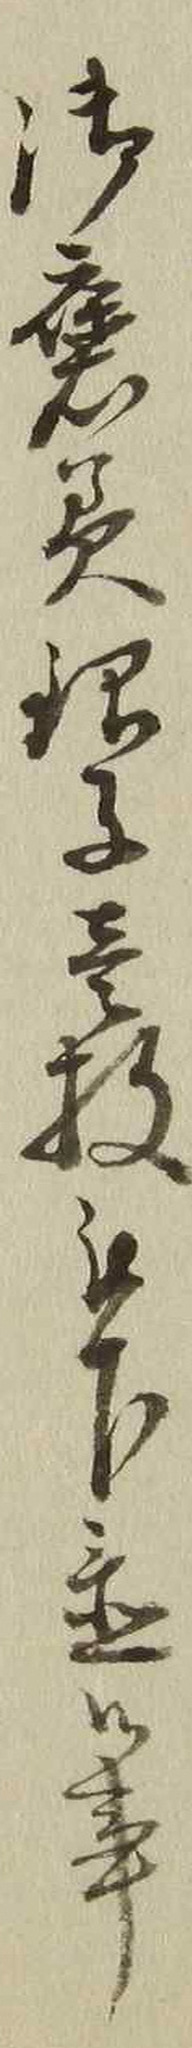御褒美銀子壱枚被下置候事
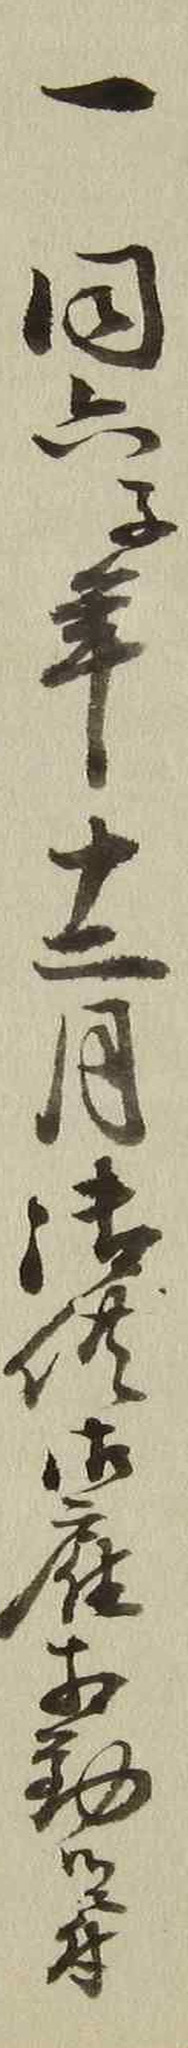一同六子年十二月御供御雇相勤候ニ付
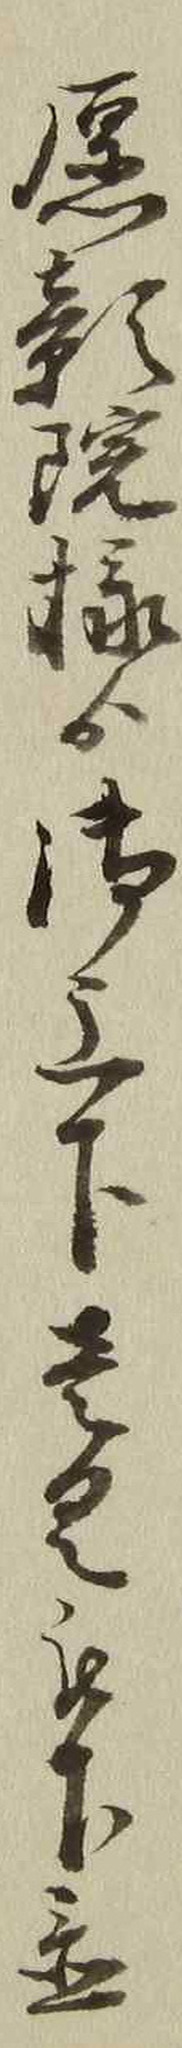愿彰院様ゟ御上下壱具被下置
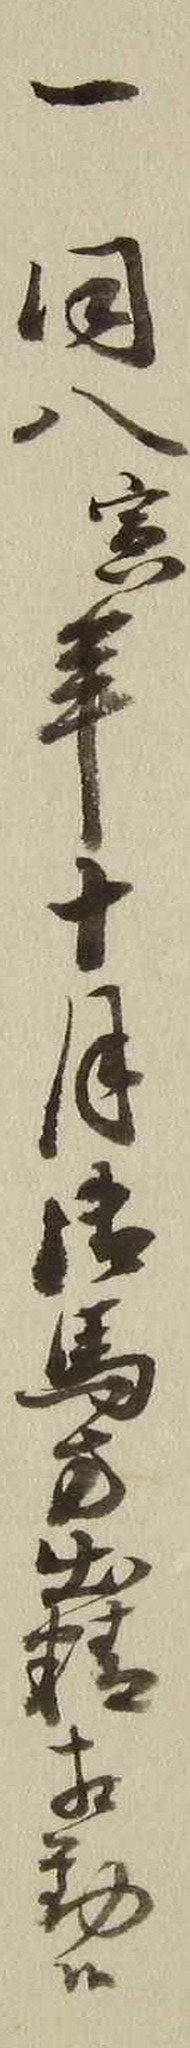一同八寅年十月御馬方出精相勤候
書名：諸士系譜　巻之31　い之部31
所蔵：会津若松市立会津図書館
